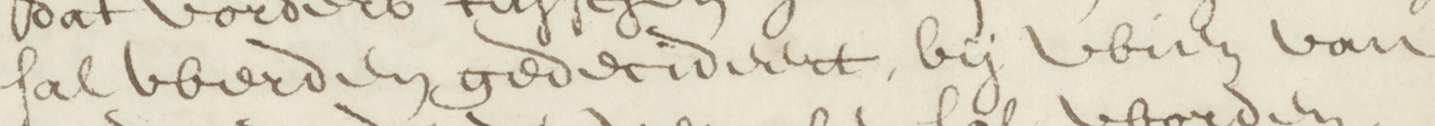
sal werden gedecideert, bij wien van
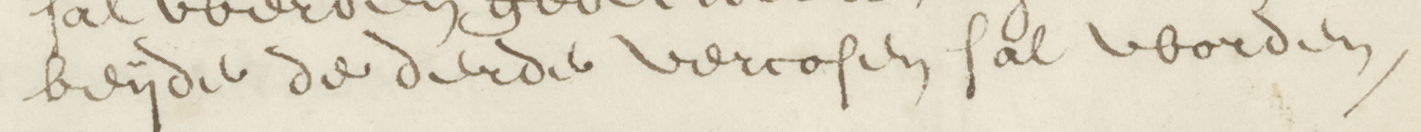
beijde de derde vercosen sal worden.
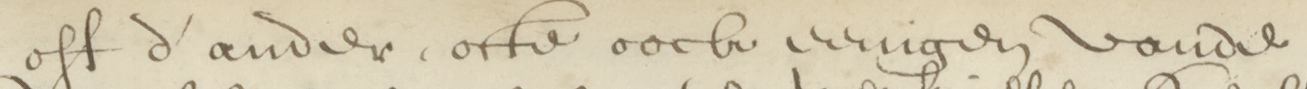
off d‛ander, ofte oock eenigen vande
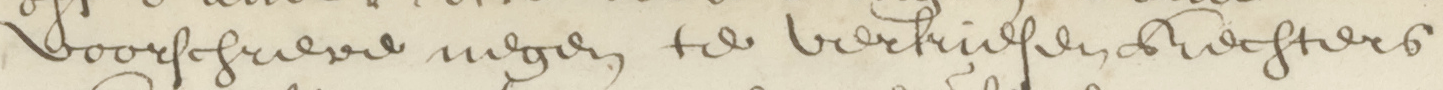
voorschreve negen te verkiesen Rechters
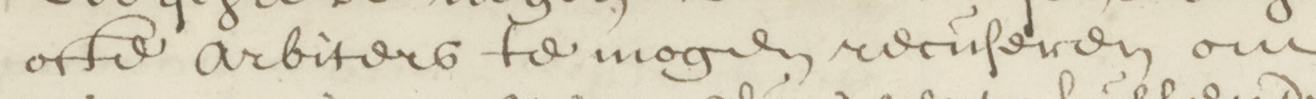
ofte Arbiters te mogen recuseren om
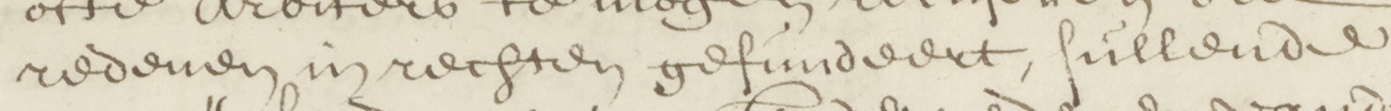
redenen in rechten gefundeert, sullende
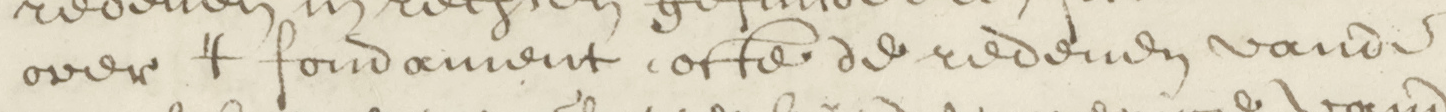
over ‛t fondament, ofte de redenen vande
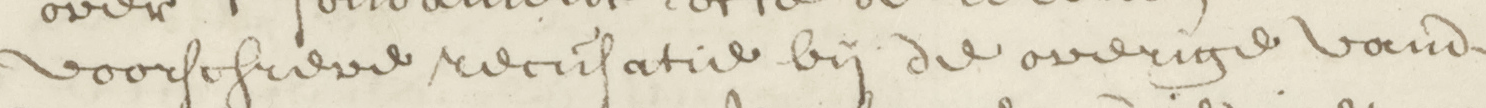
voorschreve recusatie bij de overige vande
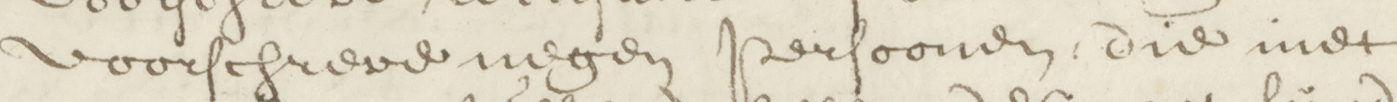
voorschreve negen Persoonen, die niet
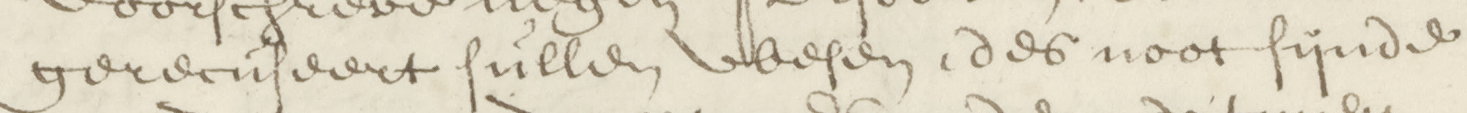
gerecuseert sullen wesen, des noot sijnde
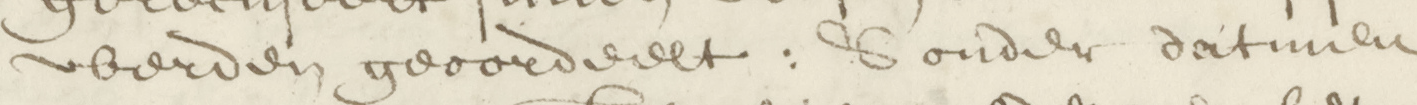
werden geoordeelt: Sonder dat men
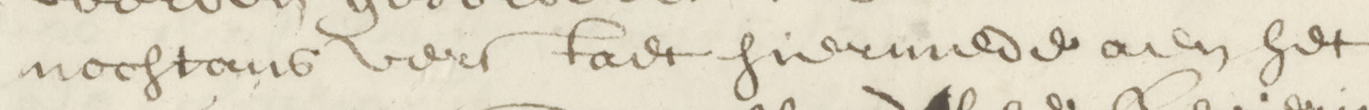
nochtans verstaet hiermede aen het
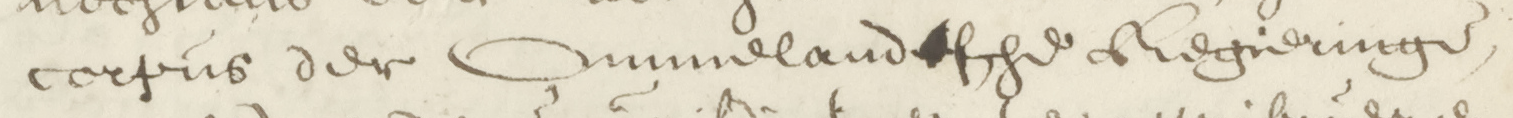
corpus der Ommelandtsche Regieringe,
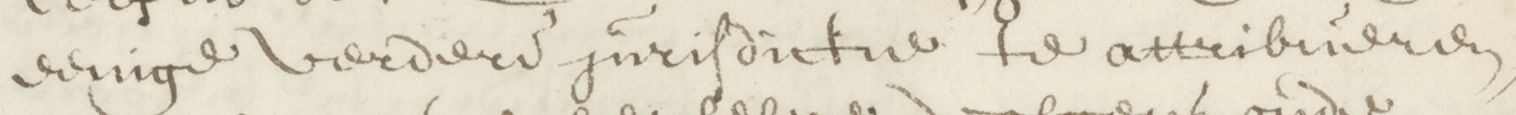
eenige verdere jurisdictie te attribueren,
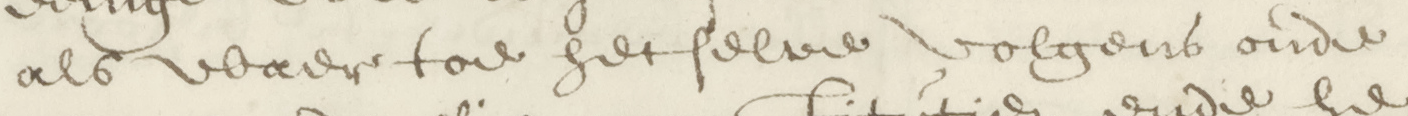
als waer toe het selve volgens oude
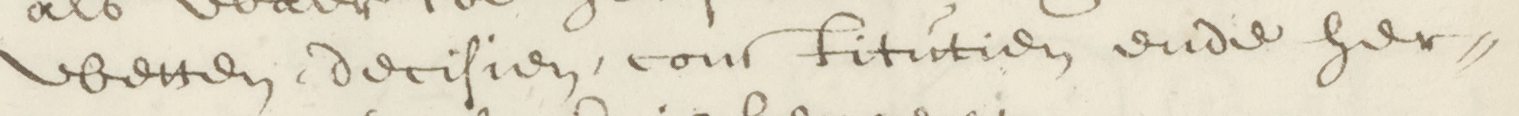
wetten, decisien, constitutien ende her„
